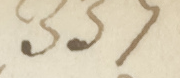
337
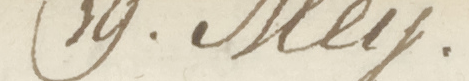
19. Meij.
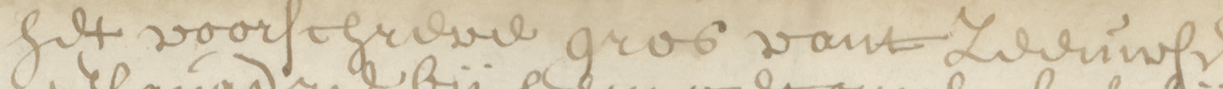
het voorschreve gros vant Zeeuwsch
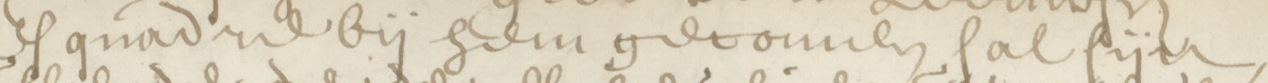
Esquadre bij hem gecomen sal sijn,
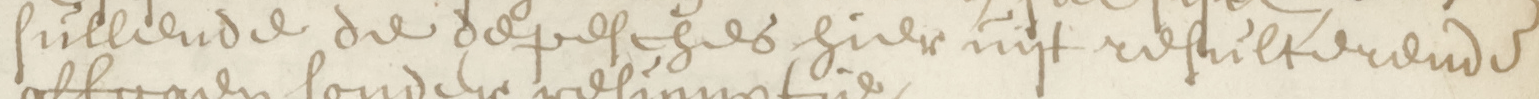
sullende de depesches hier uijt resulterende
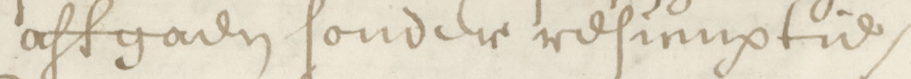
affgaen sonder resumptie.
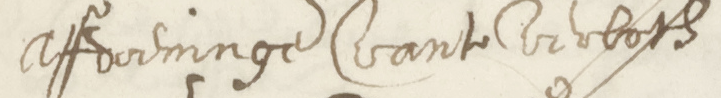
affdoeninge vant verboth
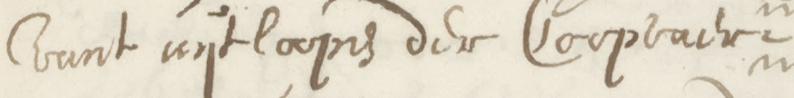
vant uijtloopen der Coopvaer„
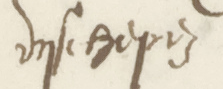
dyschepen
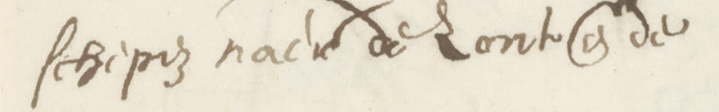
schepen naer de Zont & de
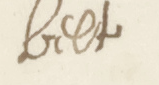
Belt
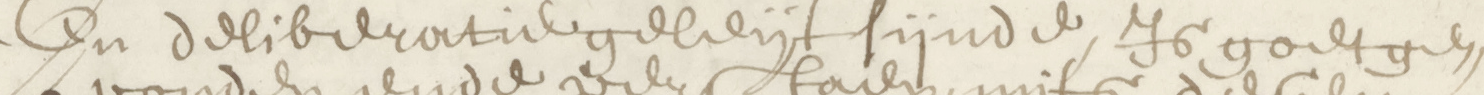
In deliberatie geleijt sijnde, Is goetge„
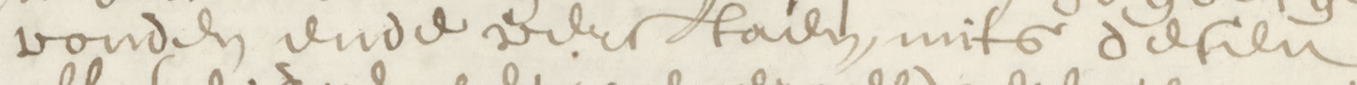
vonden ende verstaen, mits desen
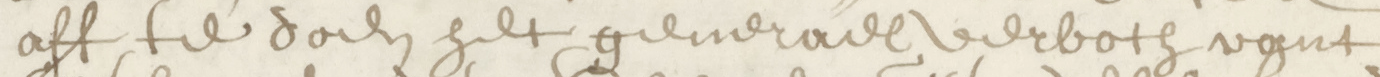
aff te doen het generael verboth vant
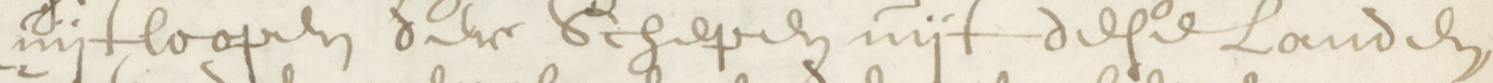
uijtloopen der Schepen uijt dese Landen,
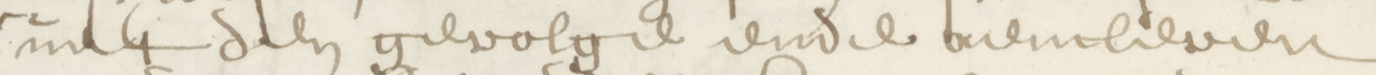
met den gevolge ende aencleven
